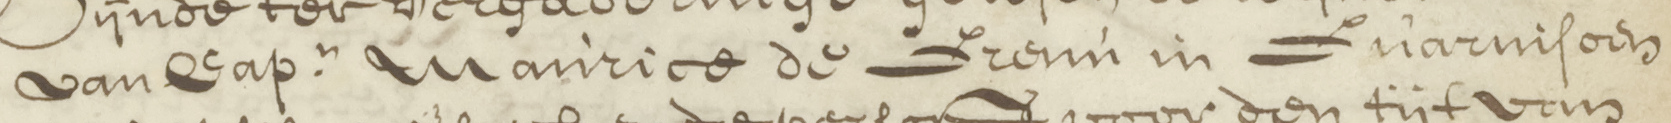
van Capn. Maurice de Grenu in Guarnisoen
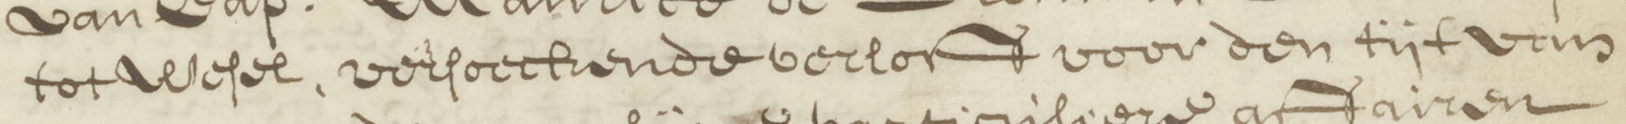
tot Wesel, versoeckende verloff voor den tijt van
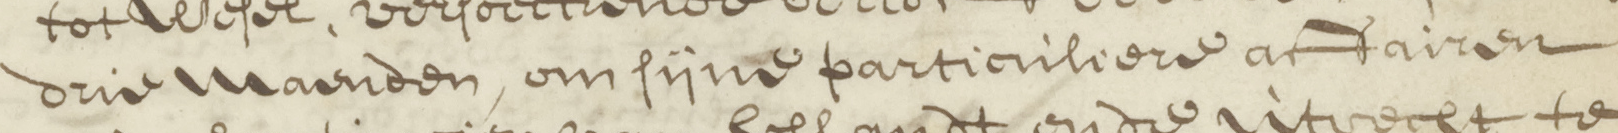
drie Maenden, om sijne particuliere affairen
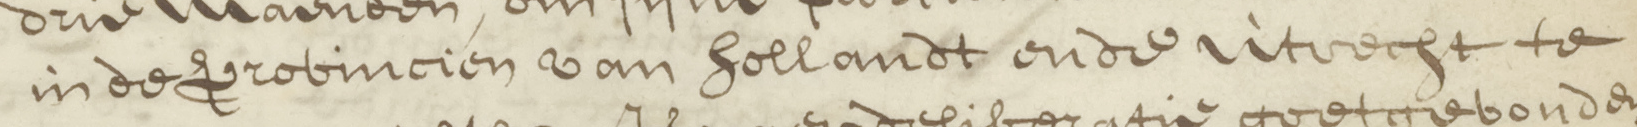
in de Provincien van hollandt ende Utrecht te
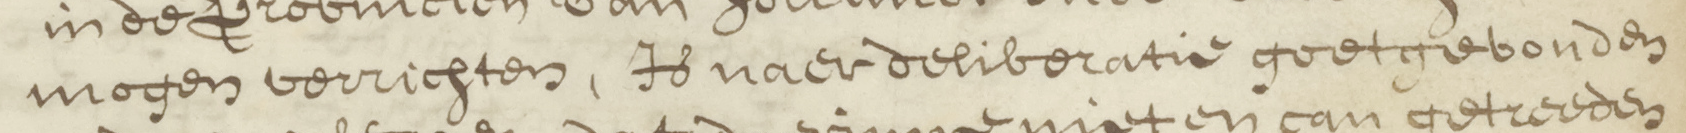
mogen verrichten, Is naer deliberatie goetgevonden
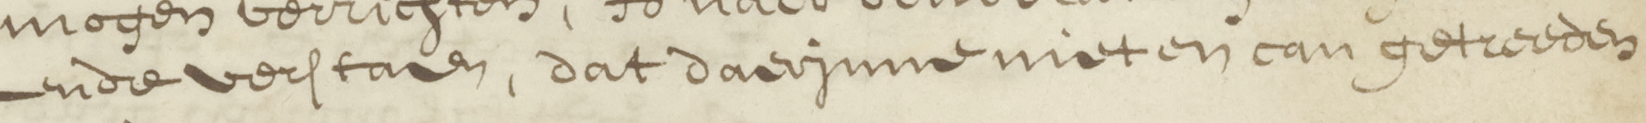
ende verstaen, dat daerinne niet en can getreeden
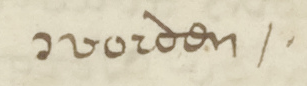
worden.
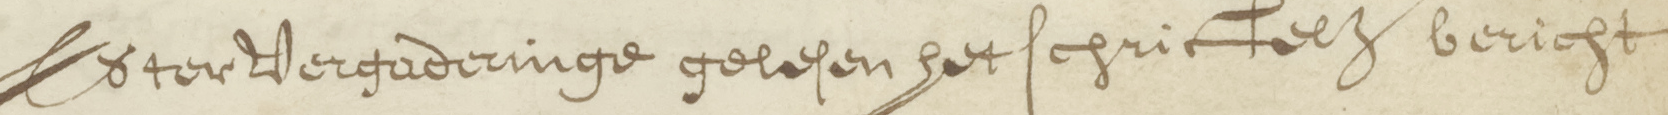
Is ter Vergaderinge gelesen het schriftel. bericht
